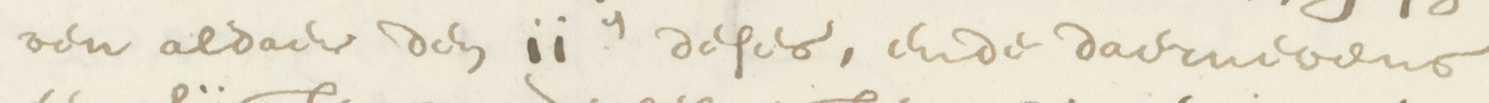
ven aldaer den iien deses, ende daernevens
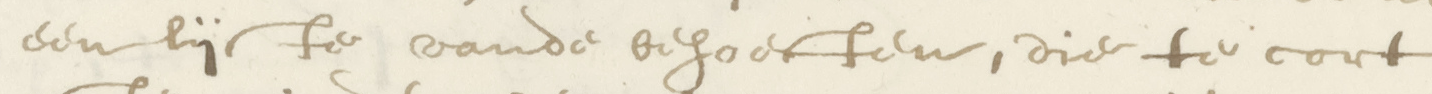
een lijste vande behoeften, die te cort
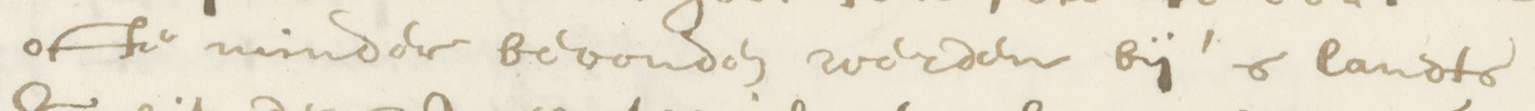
ofte minder bevonden werden bij 's landts
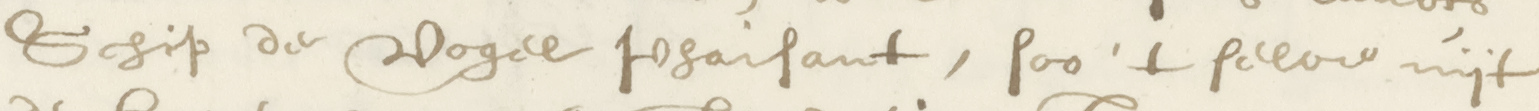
Schip de Vogel Phaisant, soo 't selve uijt
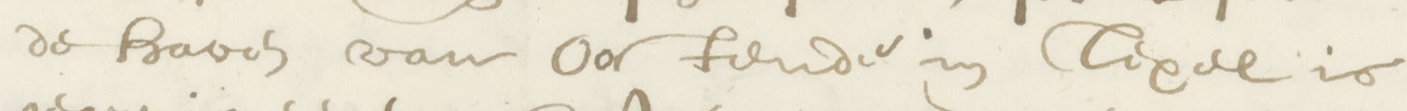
de haven van Oostende in Texel is
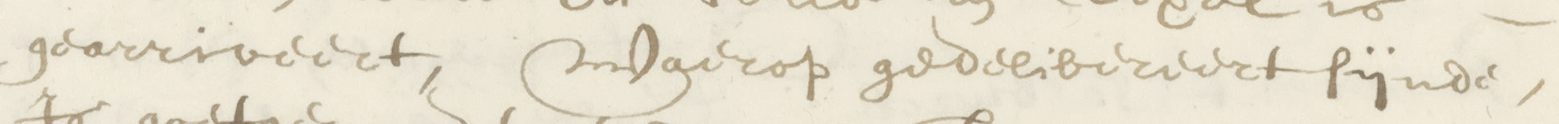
gearriveert, Waerop gedelibereert sijnde,
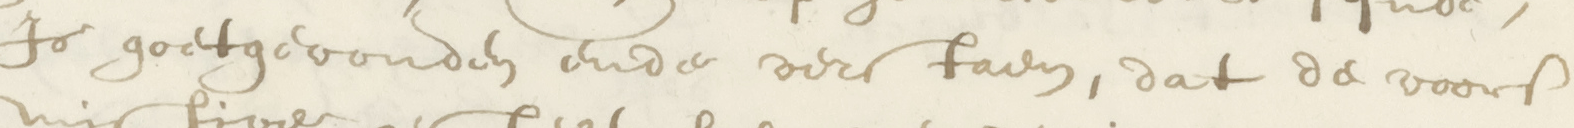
is goetgevonden ende verstaen, dat de voors
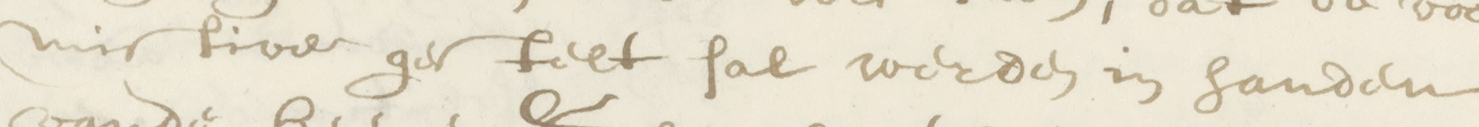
missive gestelt sal werden in handen
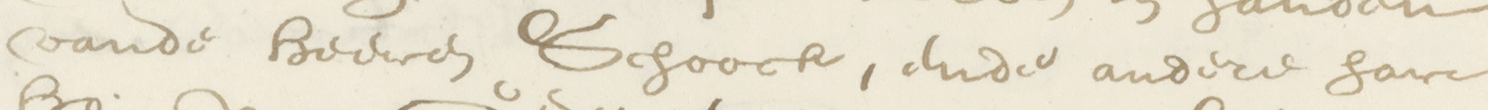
vande heeren Schoock, ende andere hare
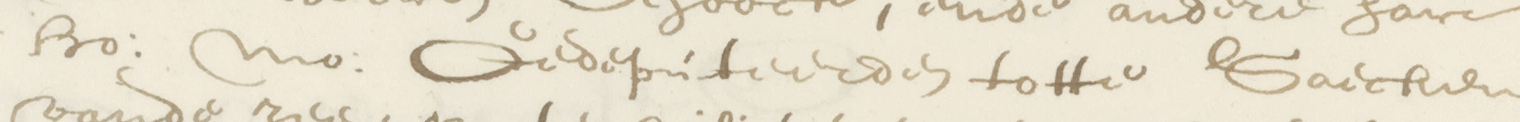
Ho:Mo: Gedeputeerden totte saecken
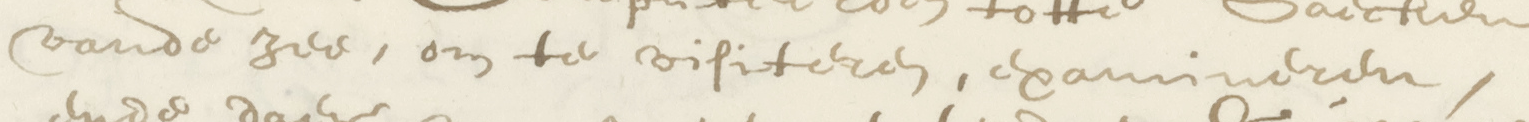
vande zee, om te visiteren, examineren,
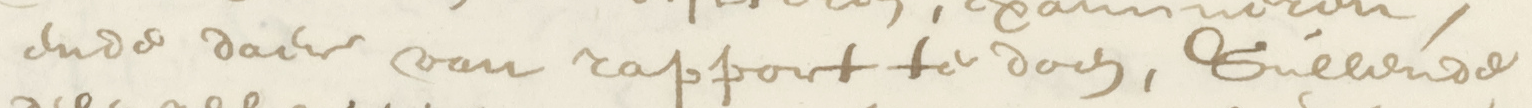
ende daer van rapport te doen, sullende
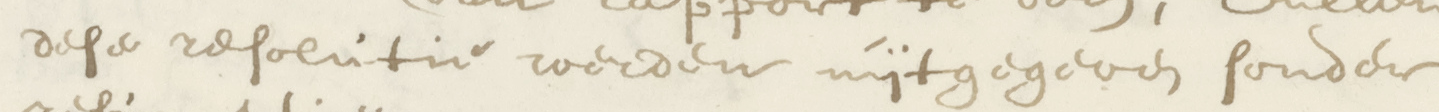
dese resolutie werden uijtgegeven sonder
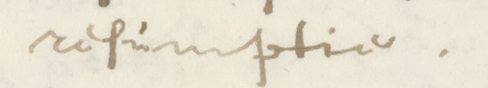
resumptie.
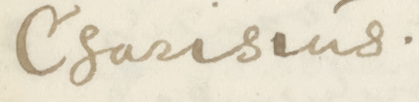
Charisius
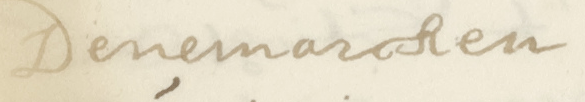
Denemarcken
